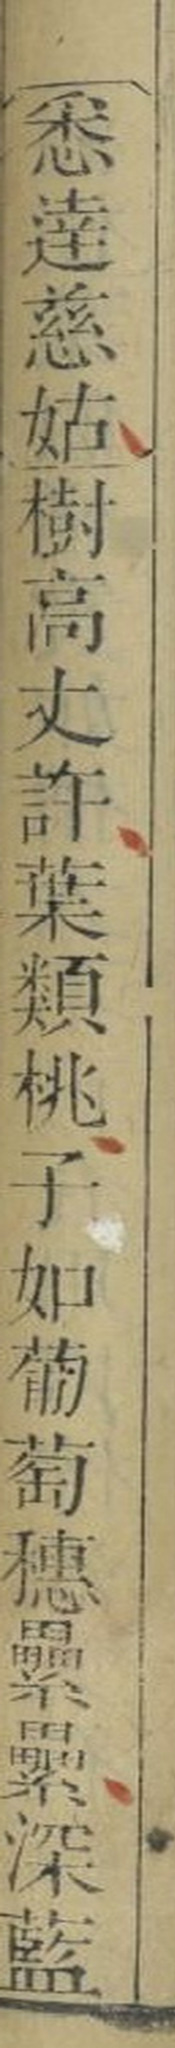[悉達慈姑]樹高丈許葉類桃子如葡萄穂纍纍深藍
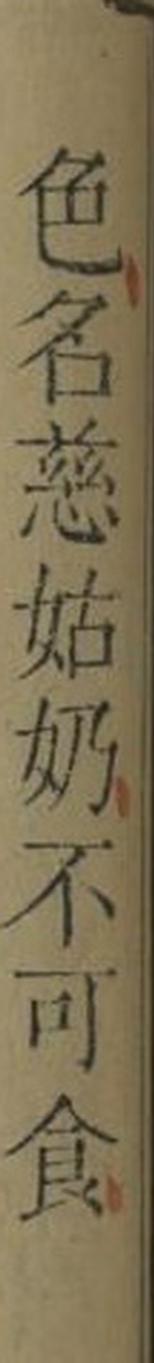色名慈姑奶不可食
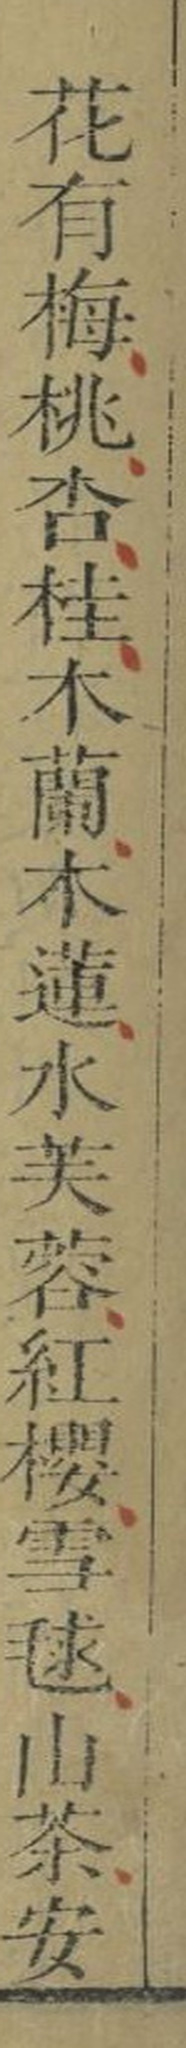花有梅桃杏桂木蘭木蓮水芙蓉紅桜雪毬山茶安
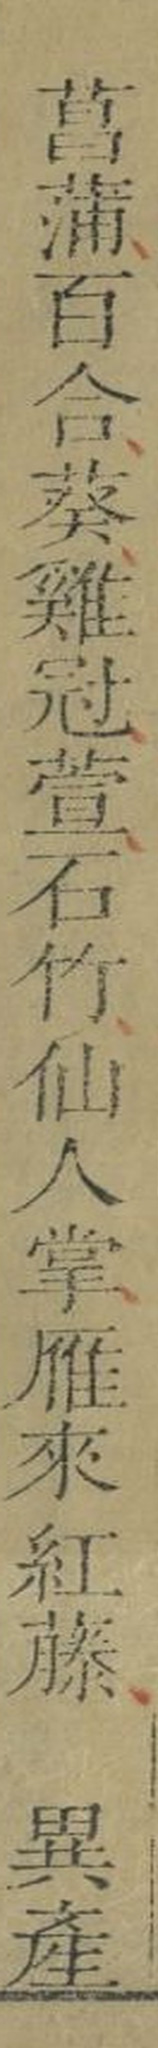菖蒲百合葵鶏冠萱石竹仙人掌雁来紅藤異産
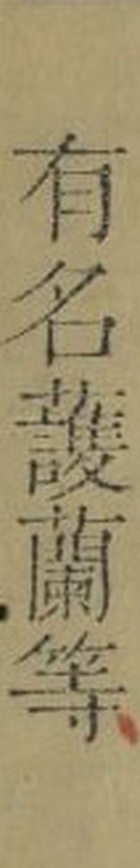有名護蘭等

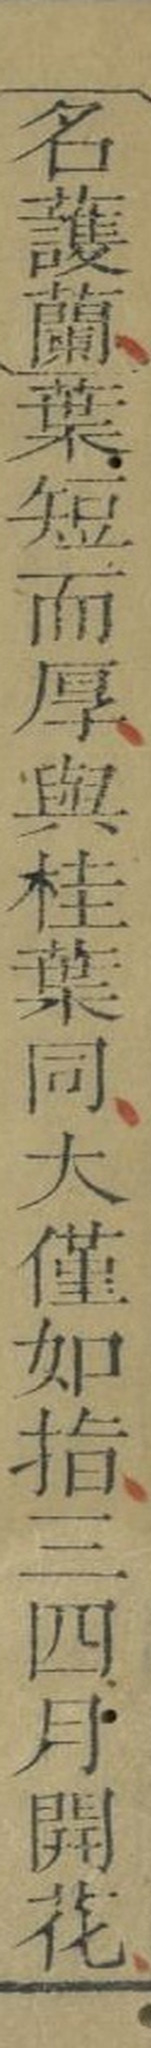[名護蘭]葉短而厚与桂葉同大僅如指三四月開花
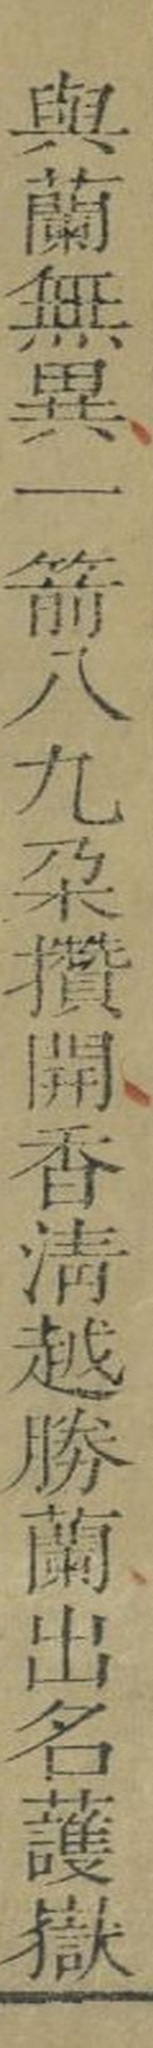与蘭無異一箭八九朶攢開香清越勝蘭出名護岳
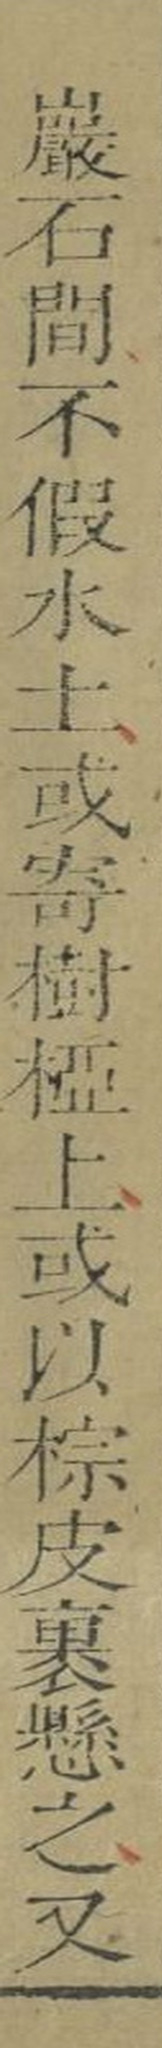巌石間不假水土或寄樹椏上或以棕皮裹懸之又
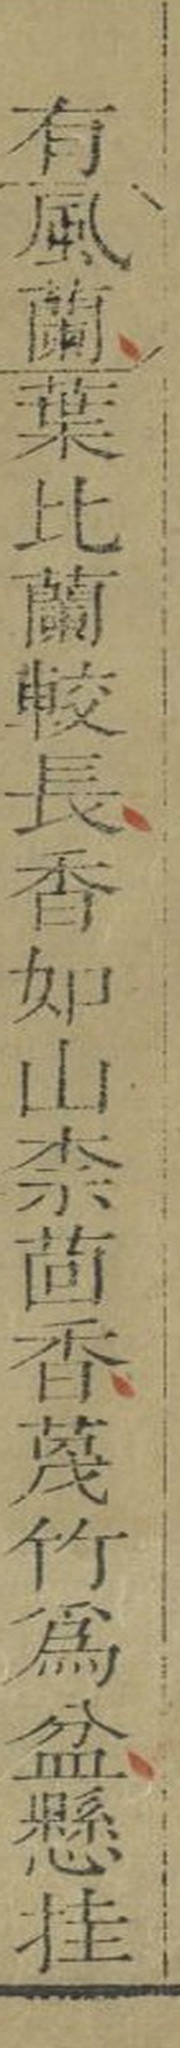有[風蘭]葉比蘭較長香如山奈茴香蔑竹為盆懸挂
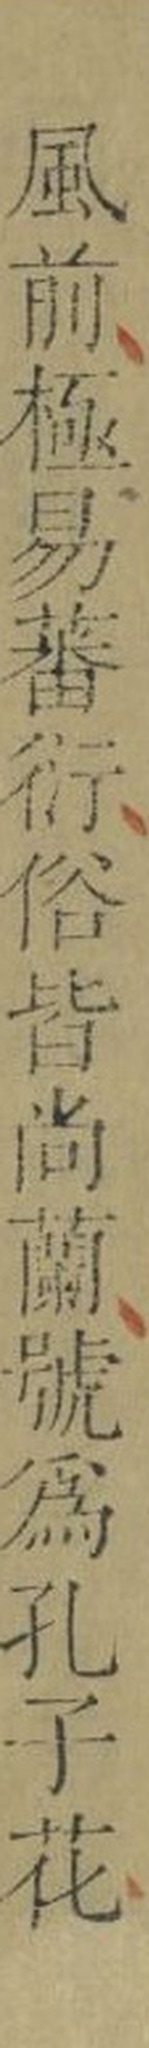風前極易蕃衍俗皆尚蘭号為孔子花
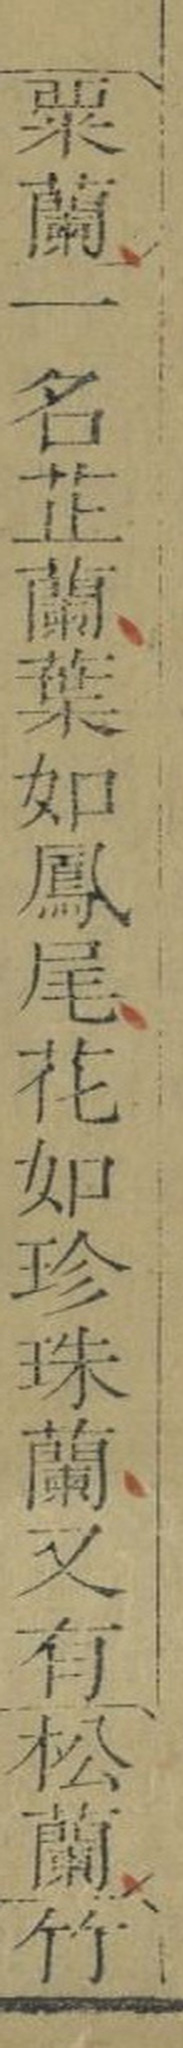[粟蘭]一名芷蘭葉如鳳尾花如珍珠蘭又有[松蘭][竹
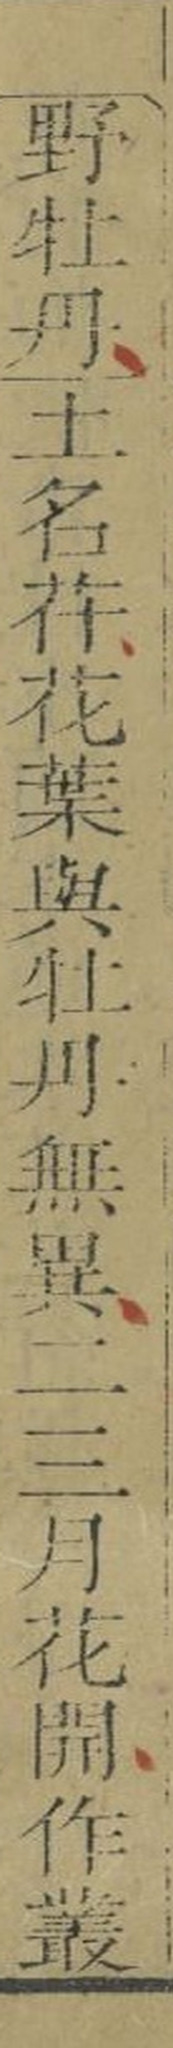[野牡丹]土名𦬯花葉与牡丹無異二三月花開作叢
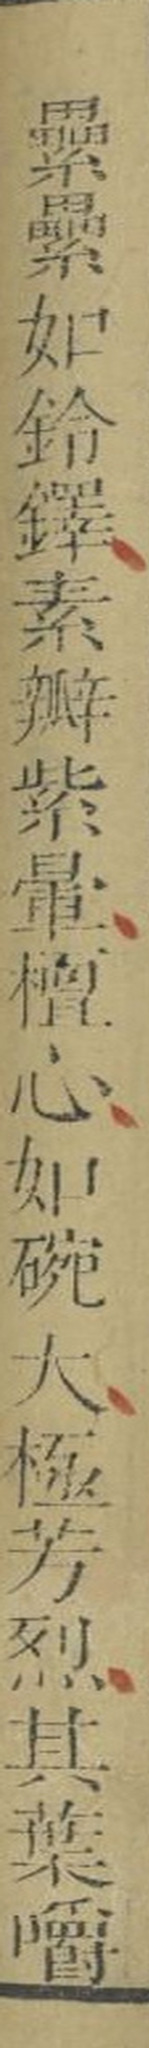纍纍如鈴鐸素弁紫暈檀心如碗大極芳烈其葉嚼
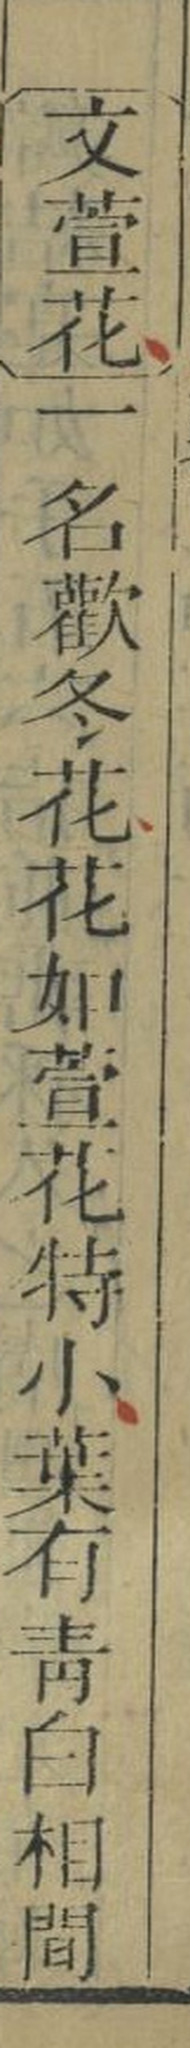[文萱花]一名歓冬花花如萱花特小葉有青白相間
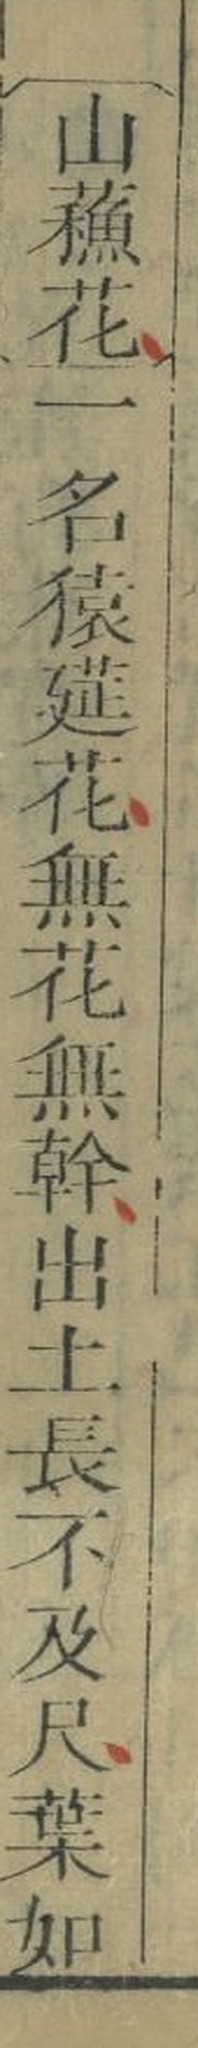[山蘓花]一名猿莚花無花無幹出土長不及尺葉如
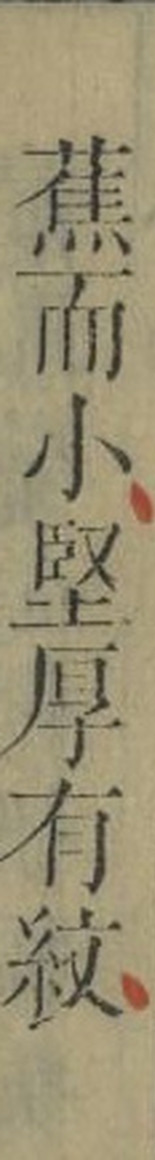蕉而小堅厚有紋
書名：中山伝信録 巻六
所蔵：University of the Ryukyus Library
